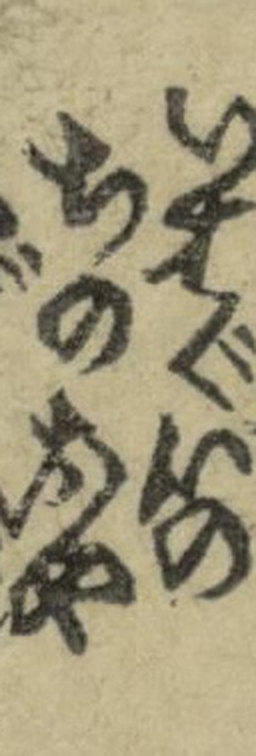ちのおや
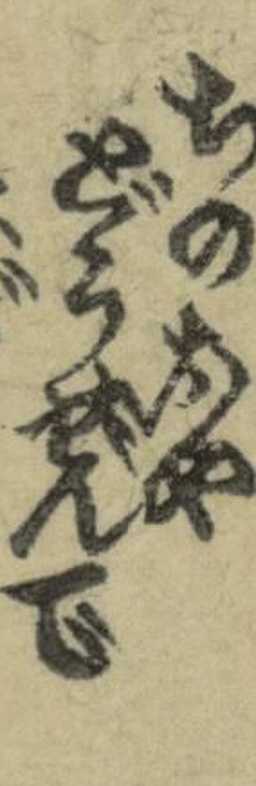どうぜんで
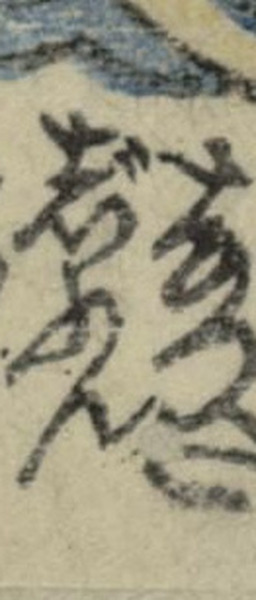じふん
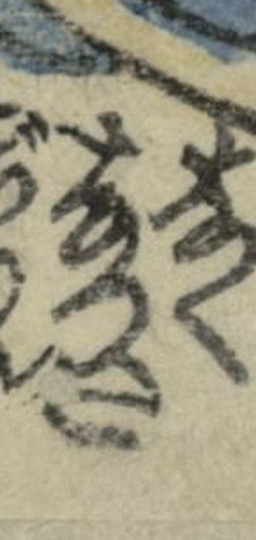なつた
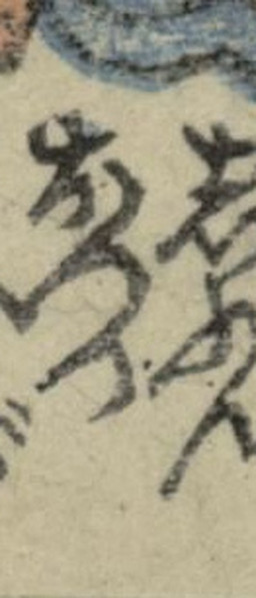おつか
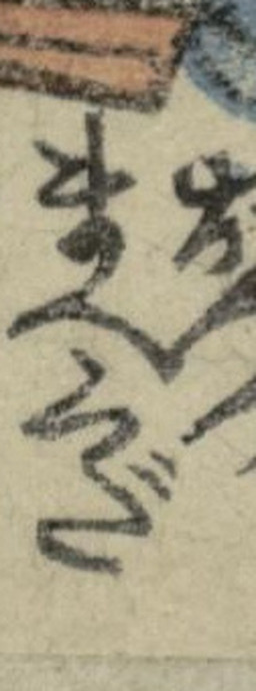まへくだ
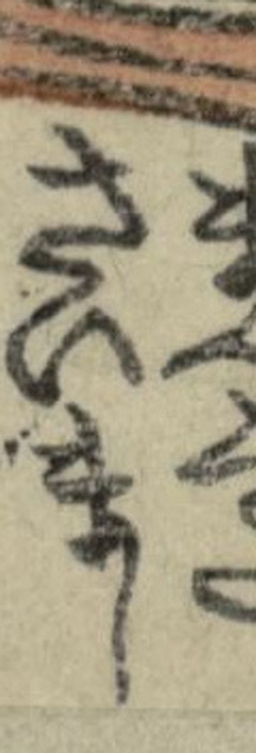さいまし
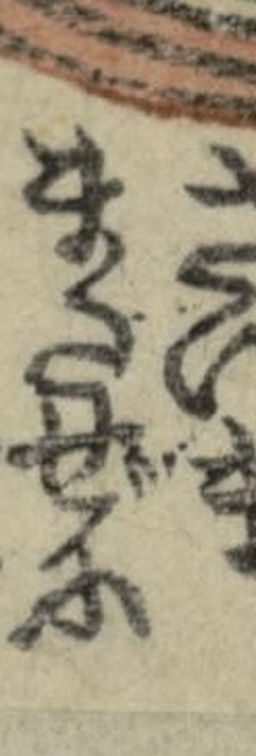またぜに
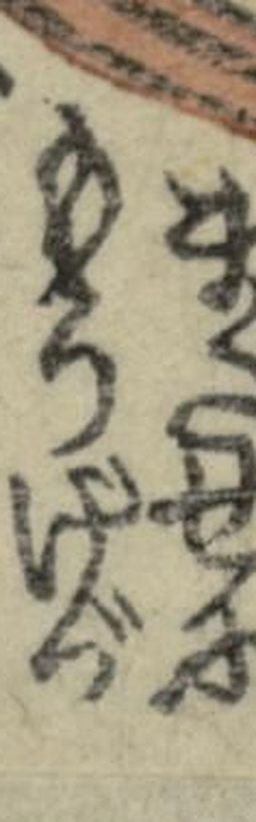もうけが
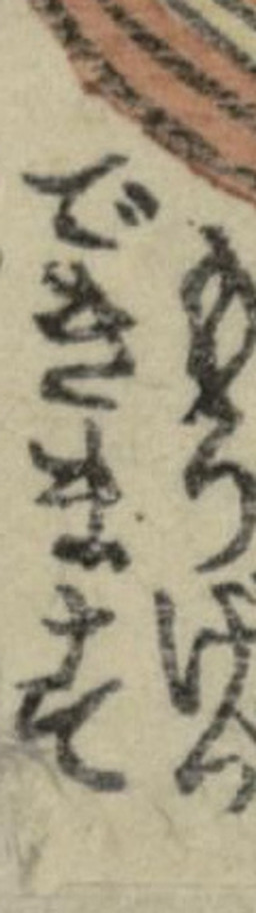できます
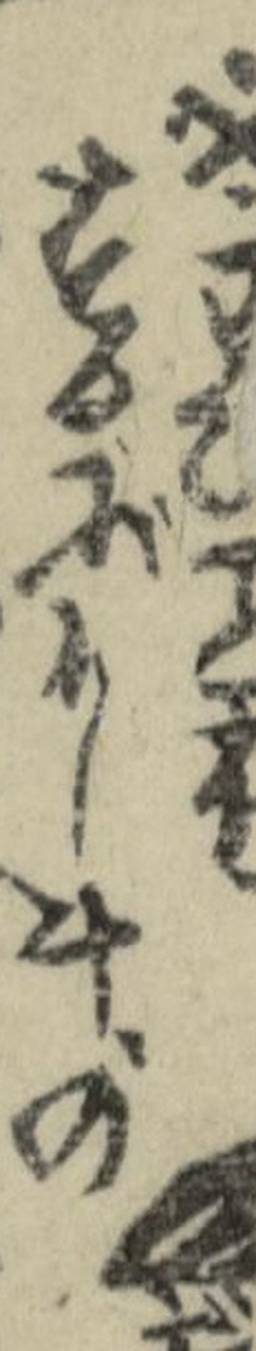するにかしまの
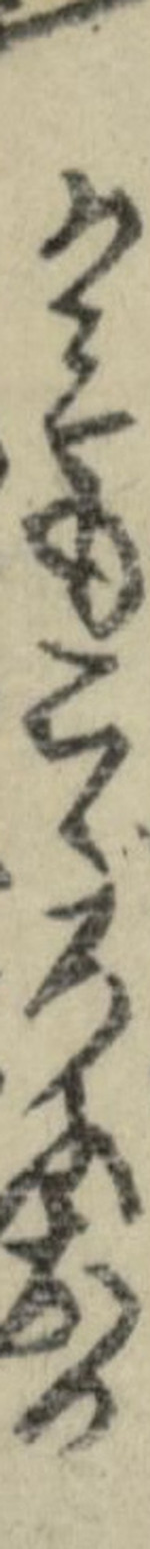かみもこゝろにおか
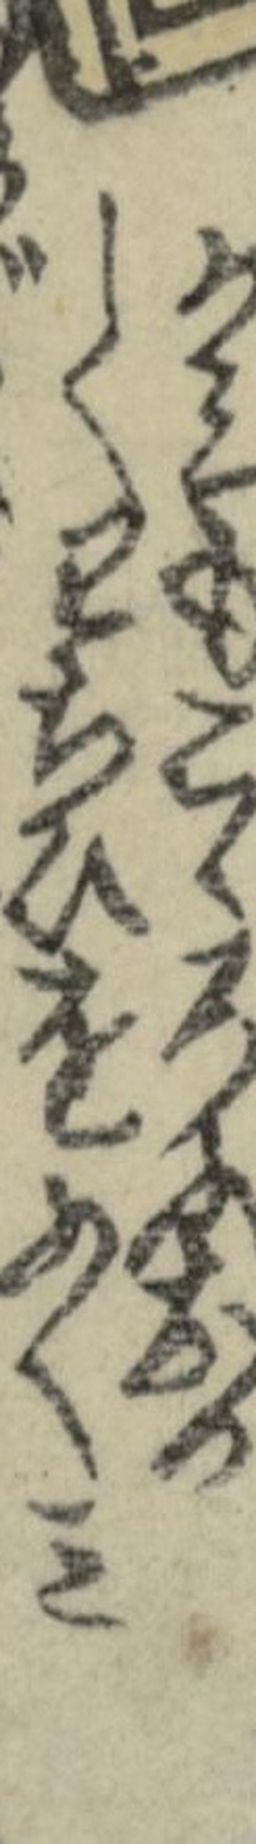しくわちひをにくみ
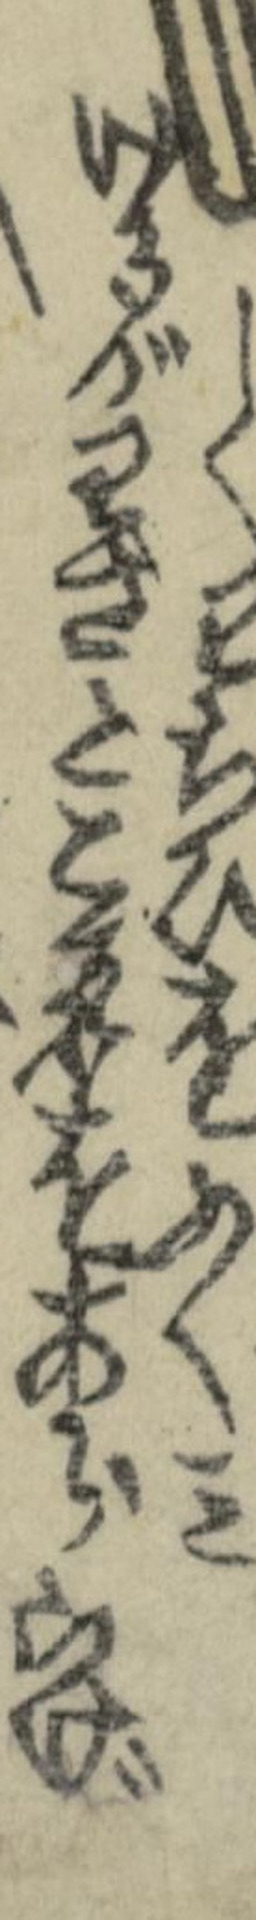いるがわさとこゑをあららげ
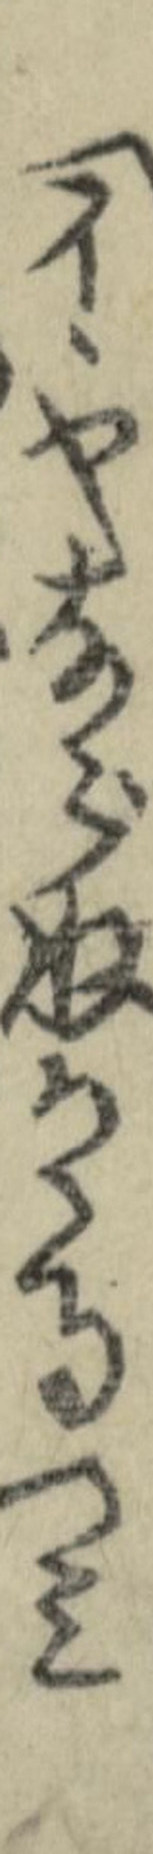〽イヽヤならぬかゝるつみ
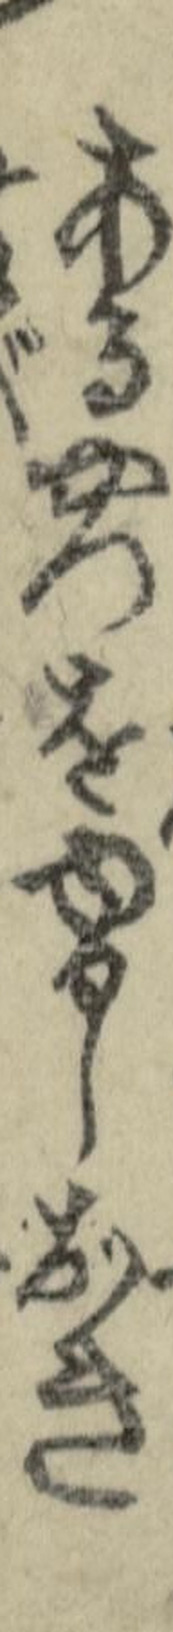あるやつをゆるしおき
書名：生捕ました三度の大地震
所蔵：東京大学地震研究所図書室 Earthquake Research Institute Library, The University of Tokyo, JAPAN
